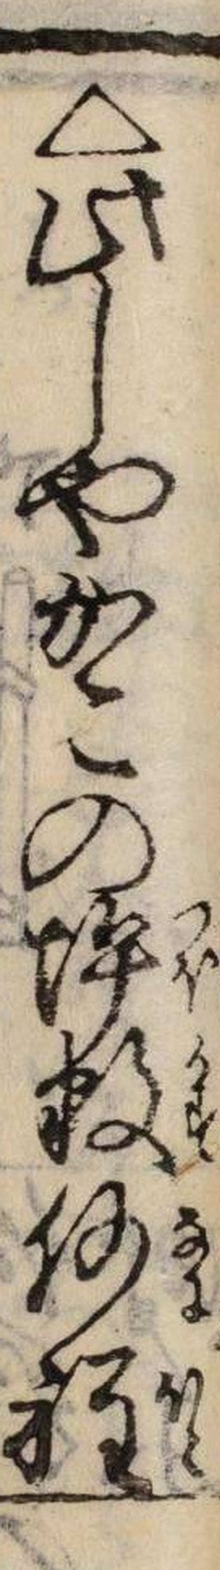△此しやかこの坪数何程
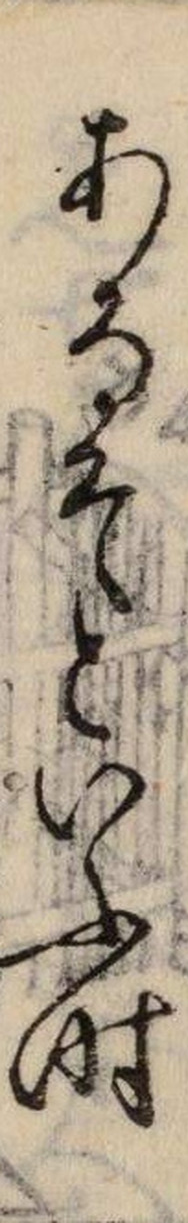あるそといふ時
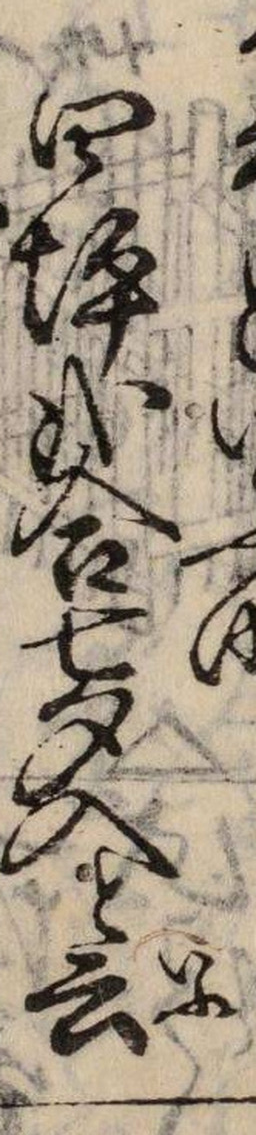四坪弐合七夕入と云
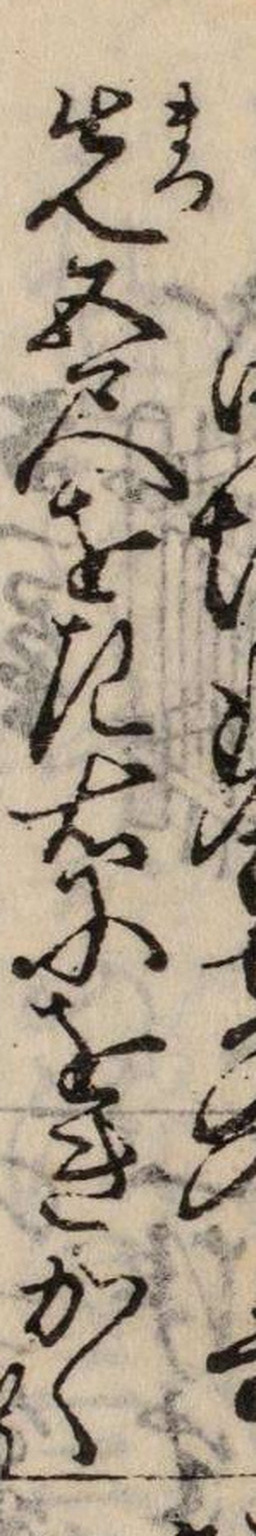先五尺を左右にをきかく
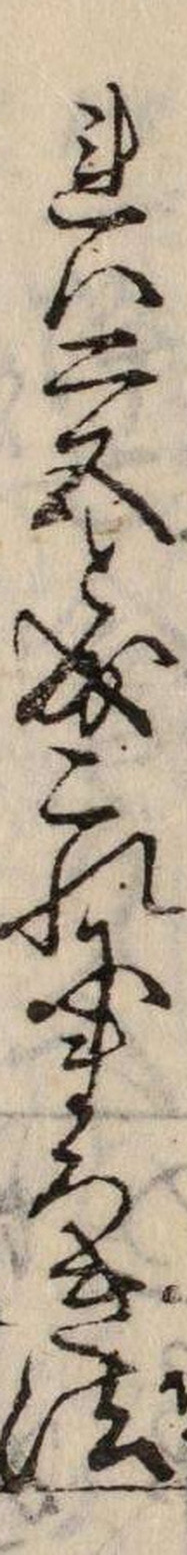れは二五と成これにまろき法
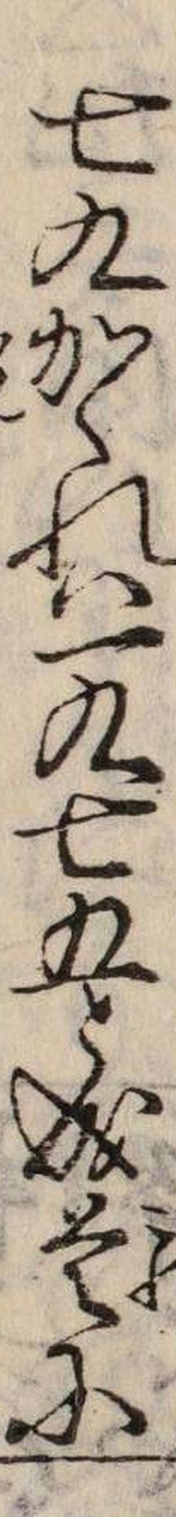七九かくれは一九七五と成是に
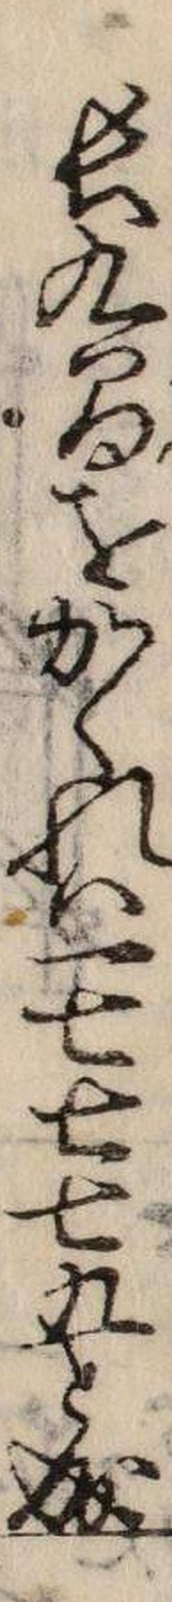長九間をかくれは一七七七五と成
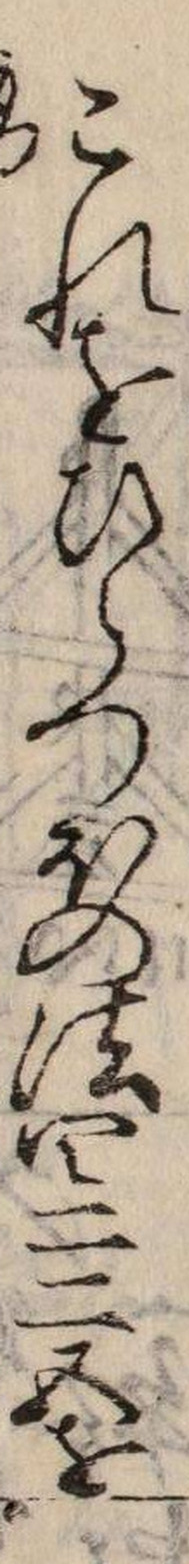これをひらつほの法四二二五を
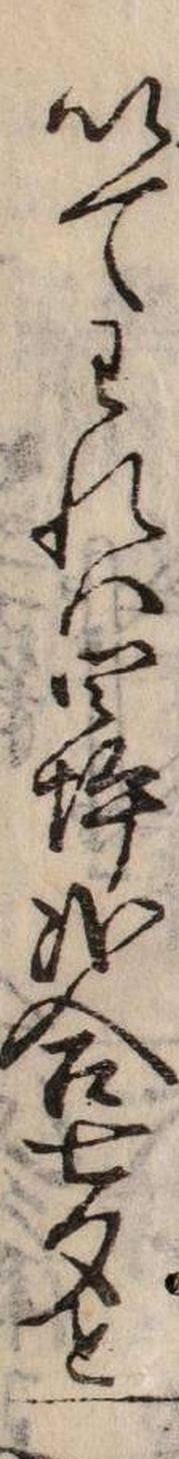以てわれは四坪弐合七勺を
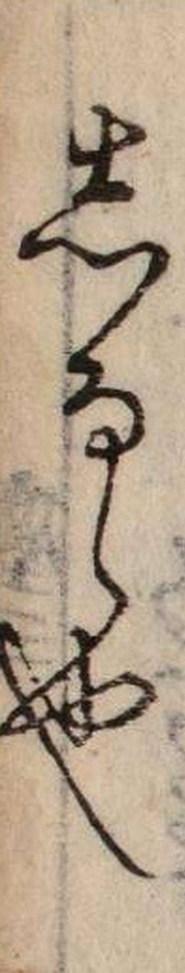しるる也

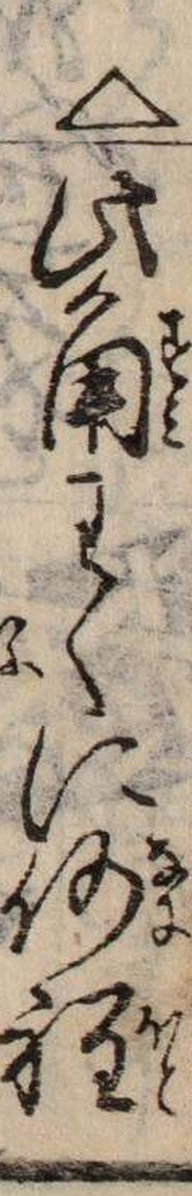△此角わくに何程
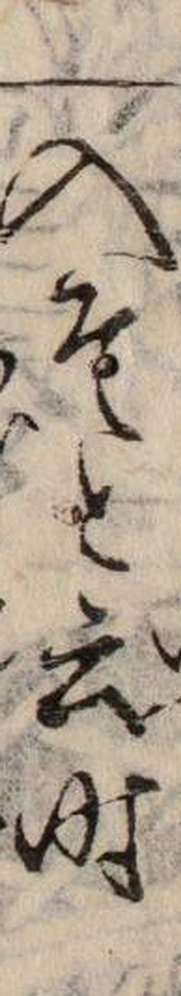入そと云時
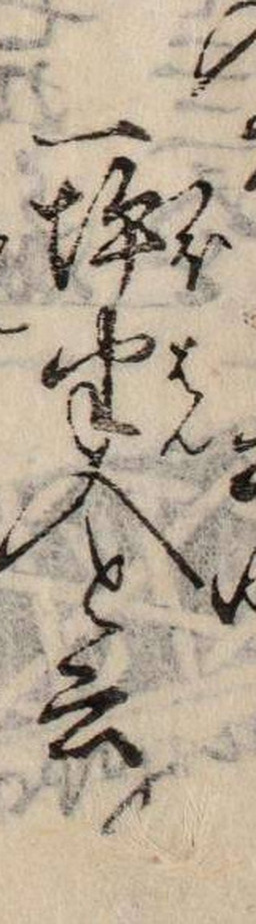一坪半入と云
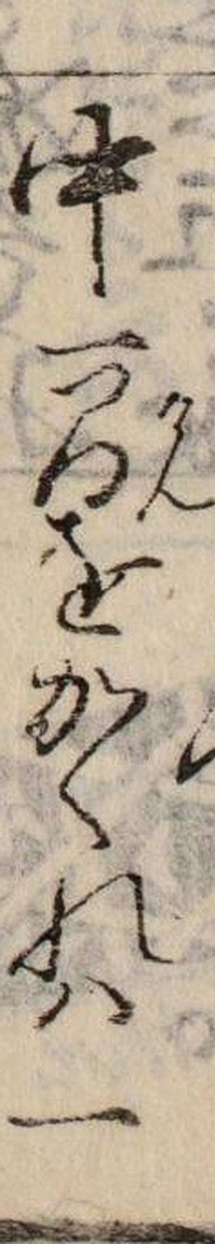中一間をかくれは一
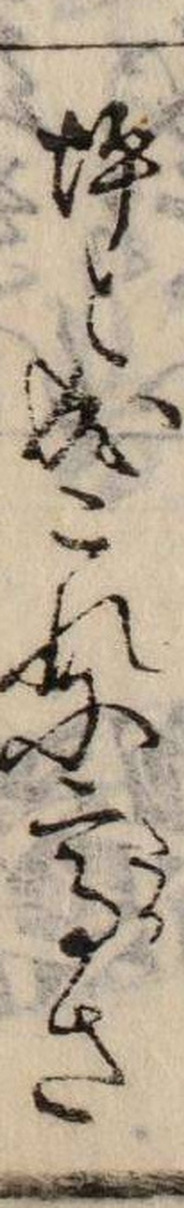坪と成これに高さ
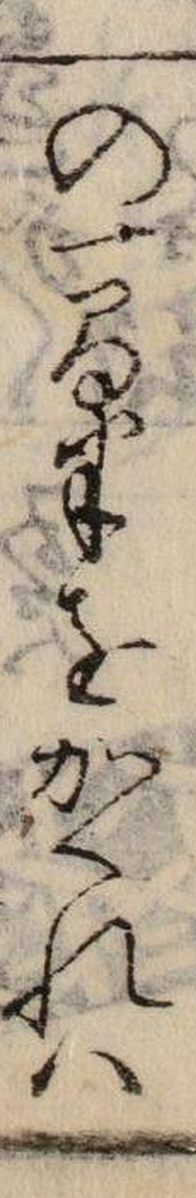の一間半をかくれは
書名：塵劫記（寛永11年自跋、京都府立京都学・歴彩館追貴8）
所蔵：京都府立京都学・歴彩館 国文学研究資料館
